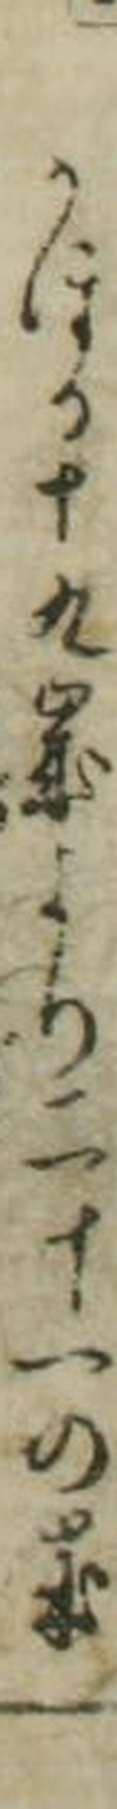かほる十九歳より二十一の歳
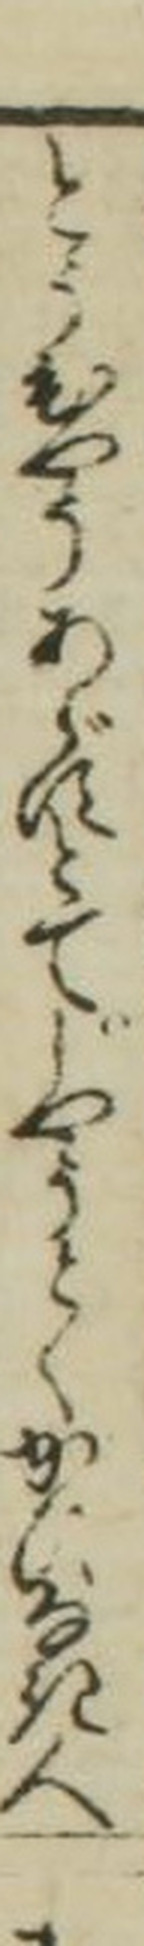とうひやうあらずとて。しやうとくかすなき人
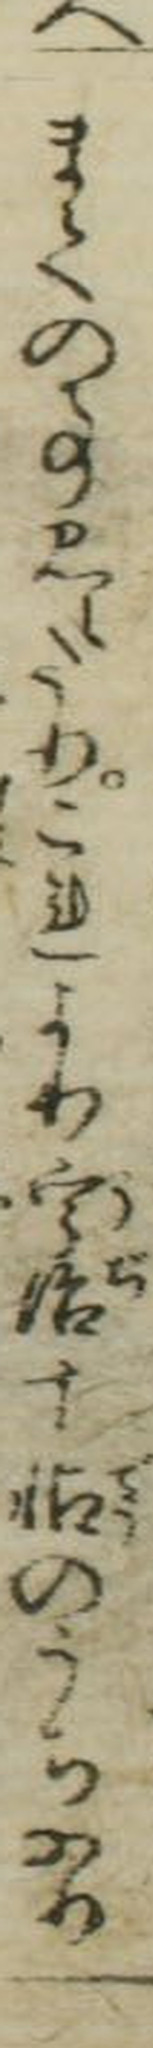まての事見えたり。これより宇治十帖のうちなり
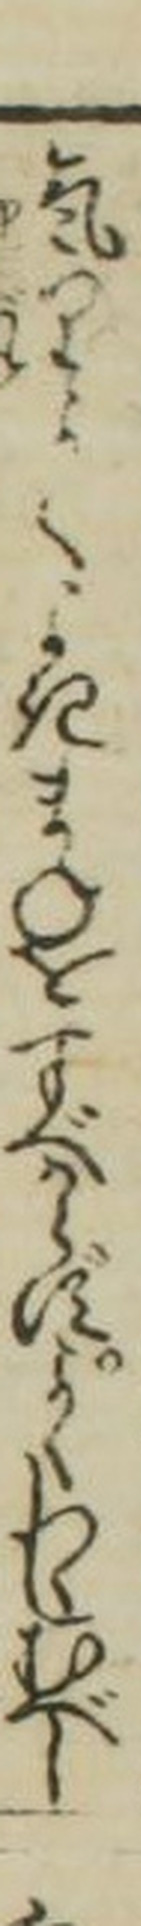気りよくよきまねをすべからず。よくつゝしむべし
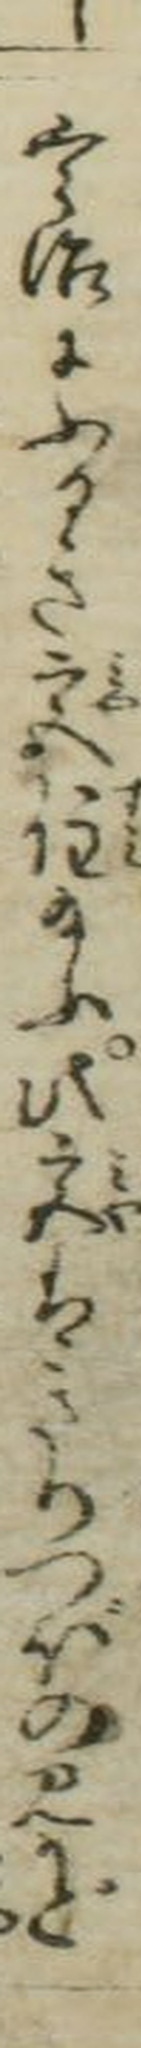宇治にふるき宮住給ふ。此宮はきりつぼのみかど
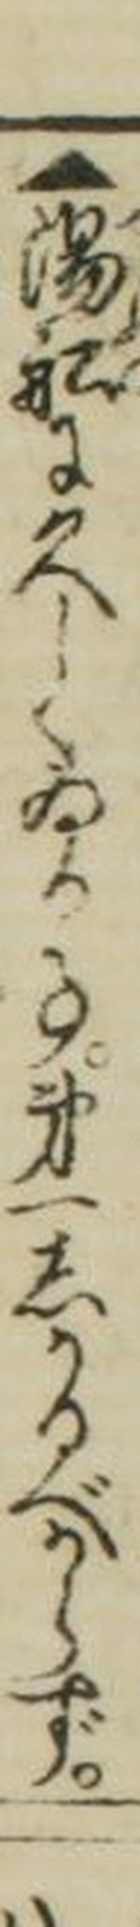▲湯船に久しくゐる事。第一しかるべからず。
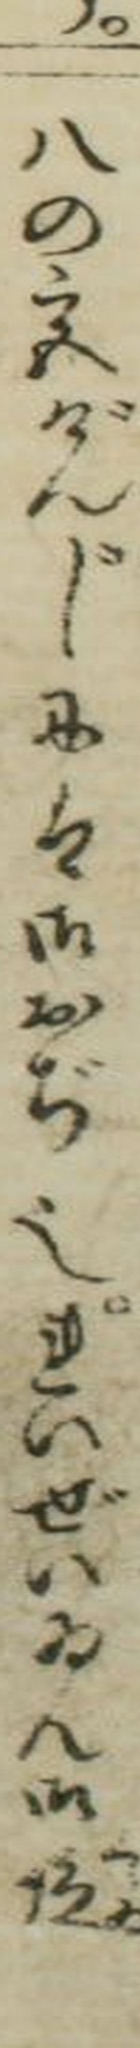八の宮げんじには御おぢ也。れいぜいゐん御位
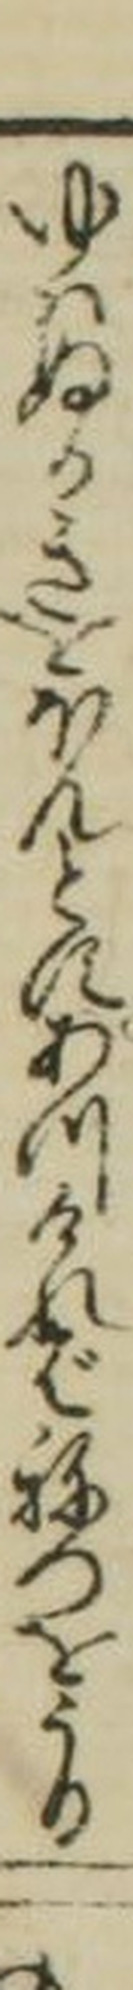ゆはぬるきをほんとす。あつければねつをうる
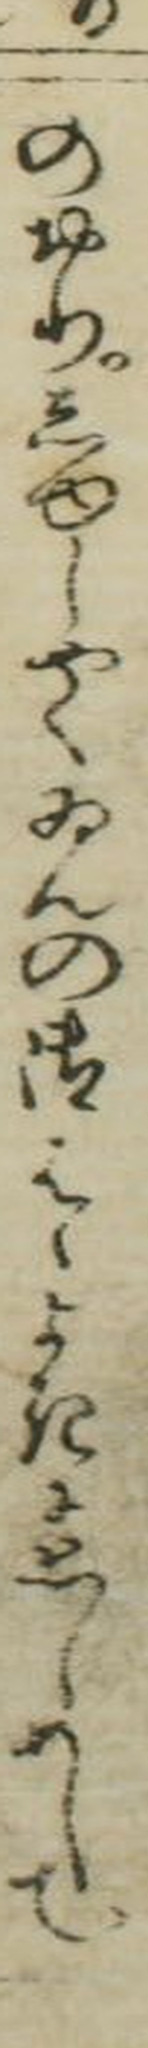のおり。しゆしやくゐんの御はゝよきに思しめして。
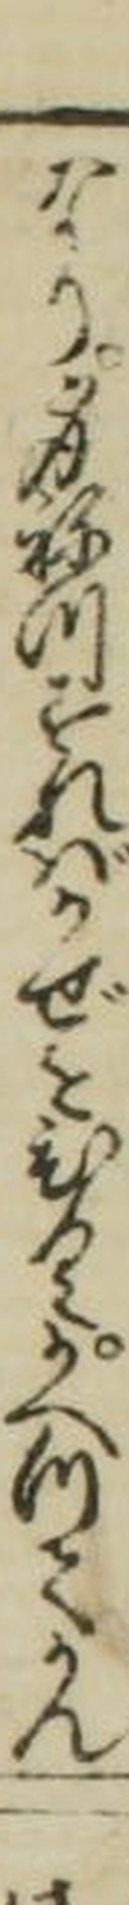なり。身ねつすればかぜをひく。かへつてかん
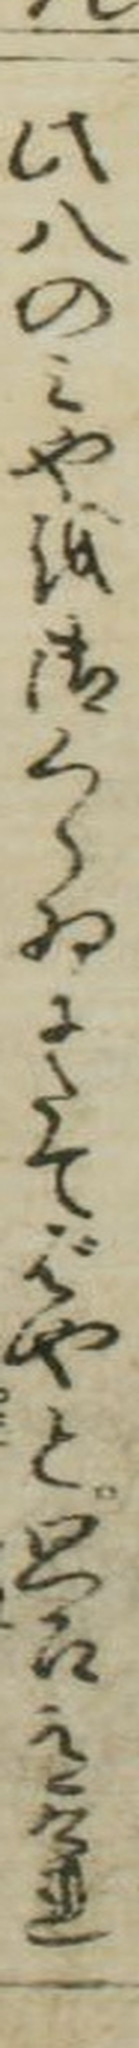此八のみやを御くらゐにたてばやと。思召有けれ
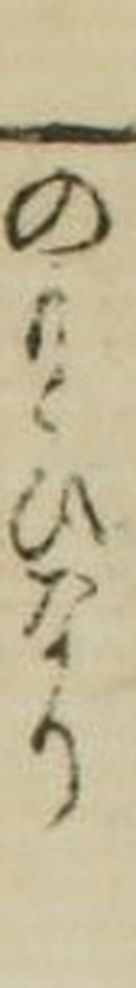のもとひなり
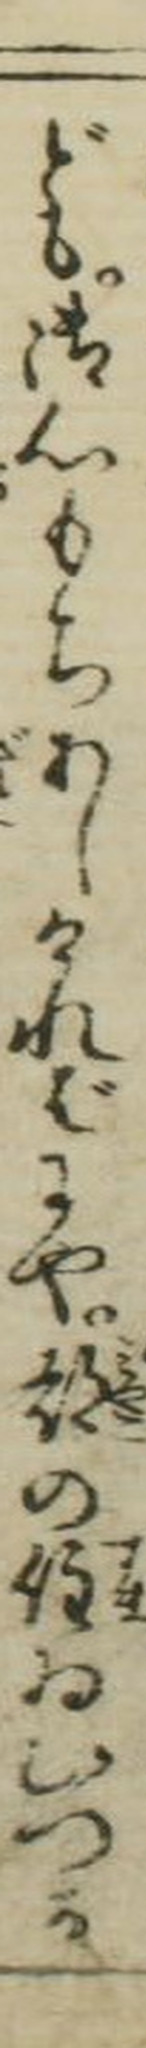ども。御心もちあしければにや。都の住ゐむつか
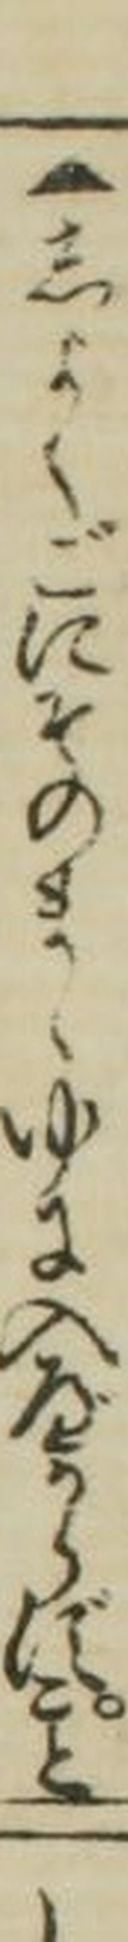▲しよくごにそのまゝゆに入べからず。こと
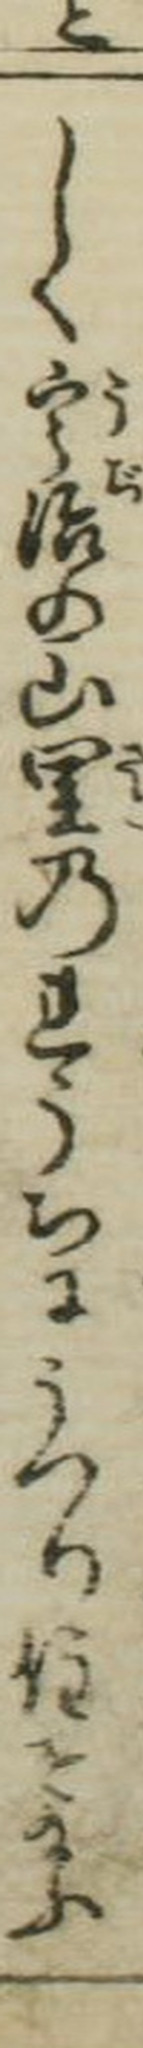しく宇治の山里のれうちにうつり住せ給ふ
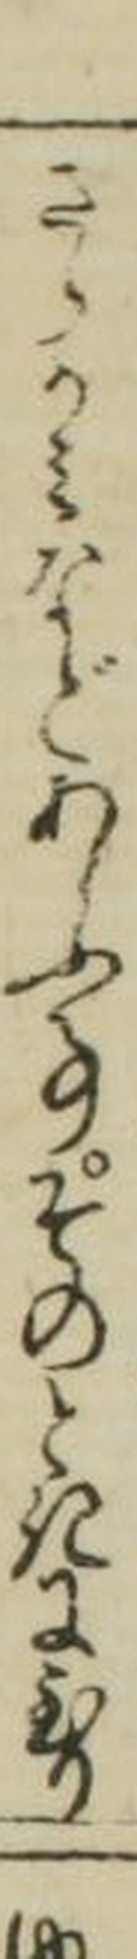さらかみなどあらふ事。そのときに至り
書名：女源氏教訓鑑
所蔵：東京学芸大学附属図書館
